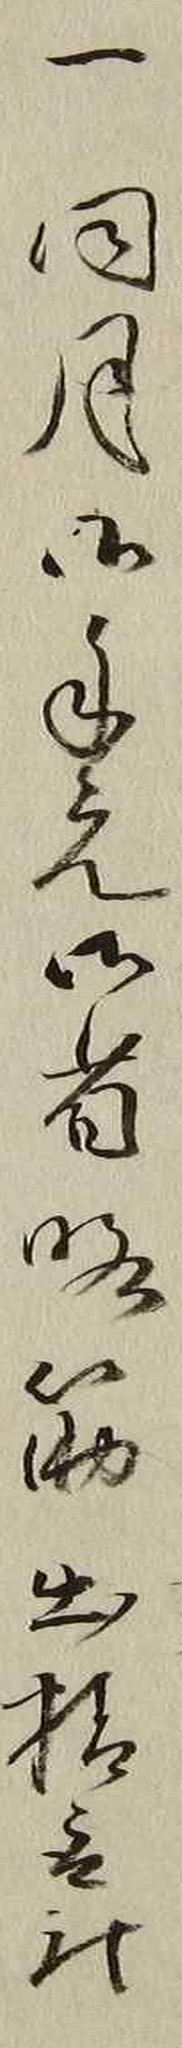一同月御手元御省略筋出精取計
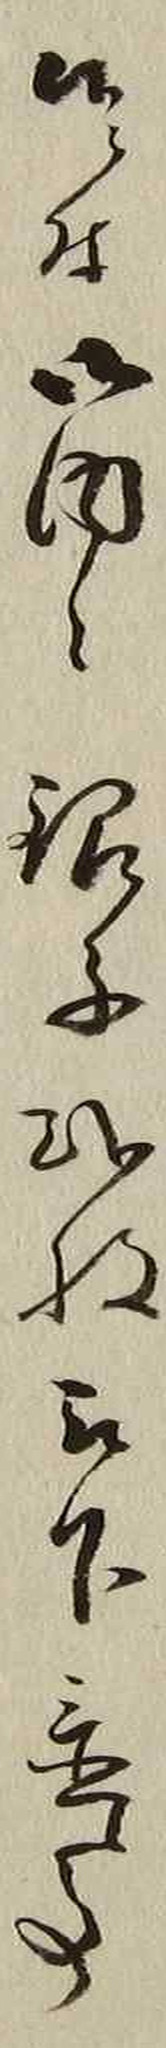候ニ付御内々銀子弐枚被下置候事
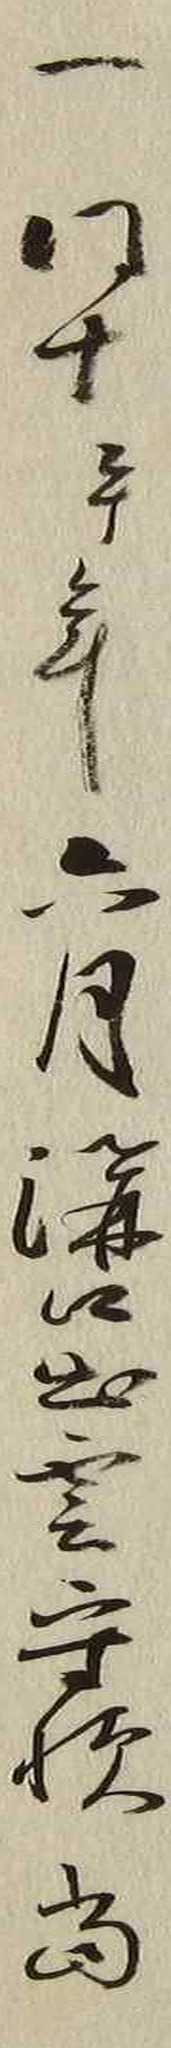一同十午年六月溝口出雲守様当
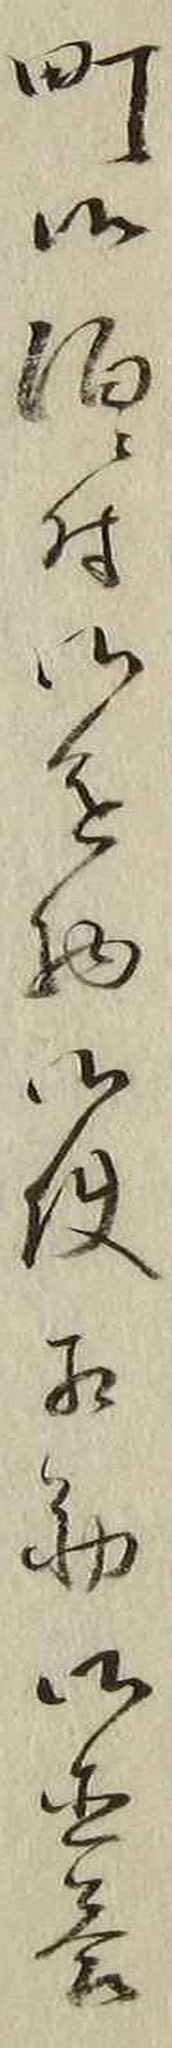町御泊ニ付御進物御使相勤御直答
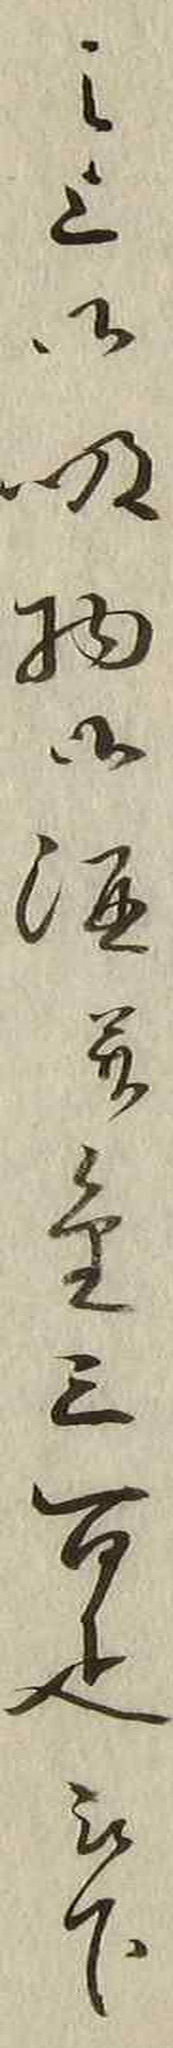之上御吸物御酒并金三百疋被下
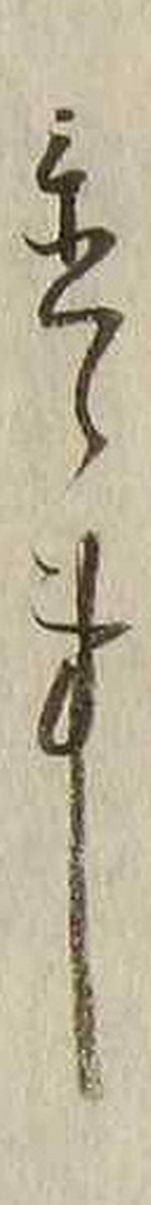置候事
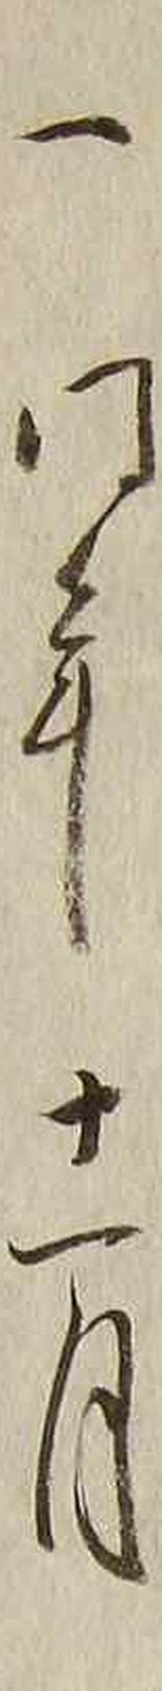一同年十一月
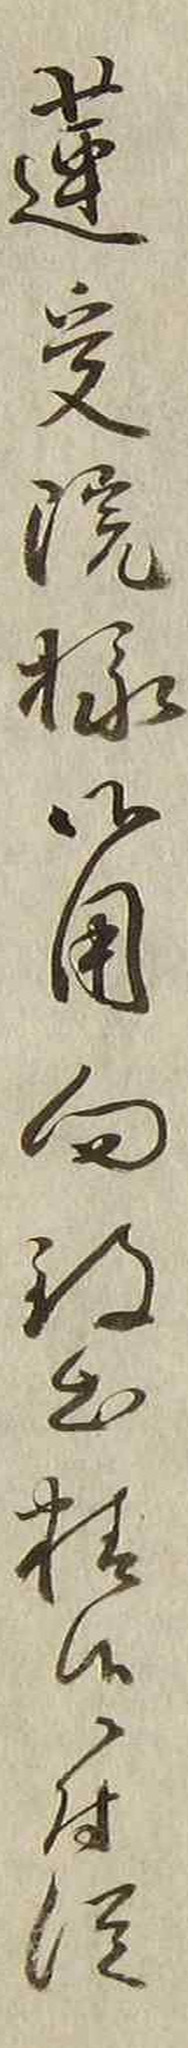蓮受院様御用向致出精候ニ付従
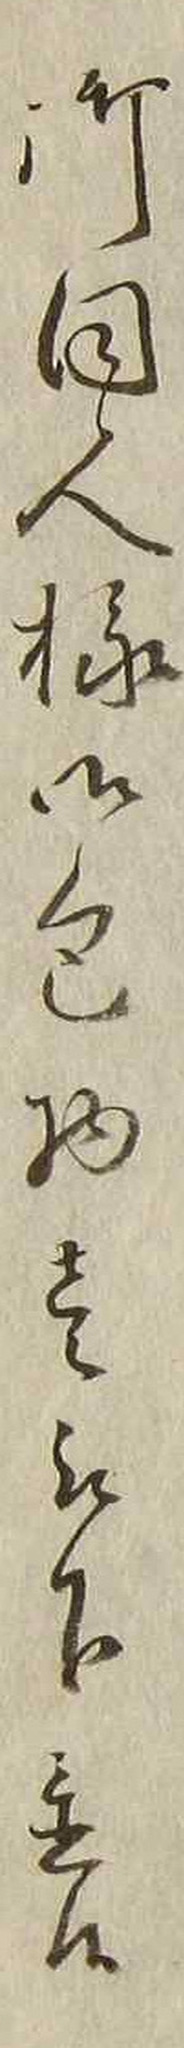御同人様御包物壱被下置候
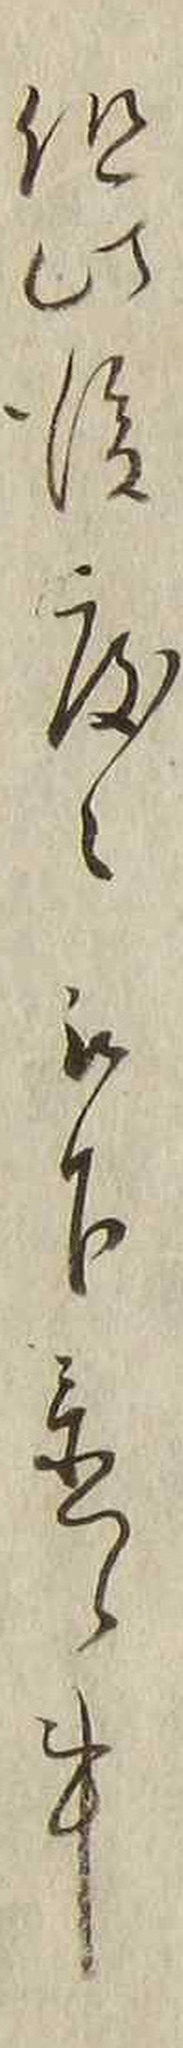但此後度々被下置候事

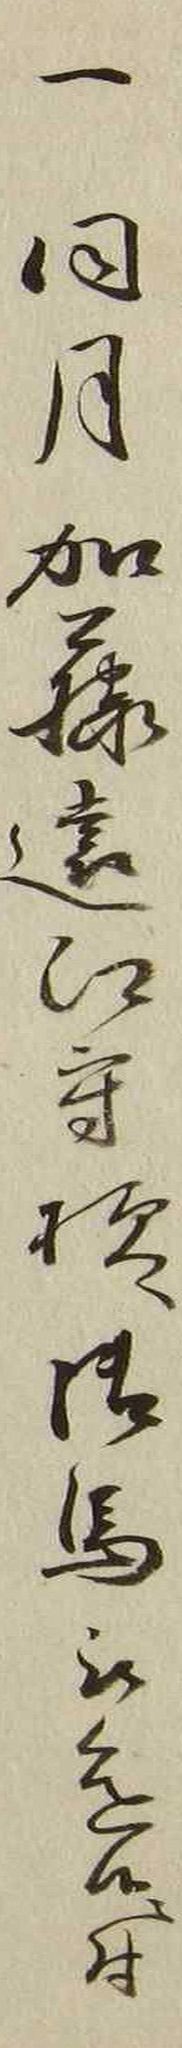一同月加藤遠江守様へ御馬被進候ニ付
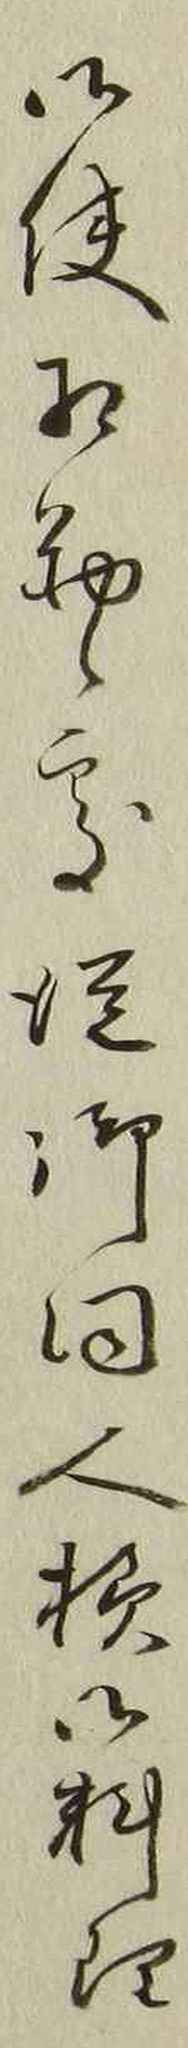御使相勤候処従御同人様御料理
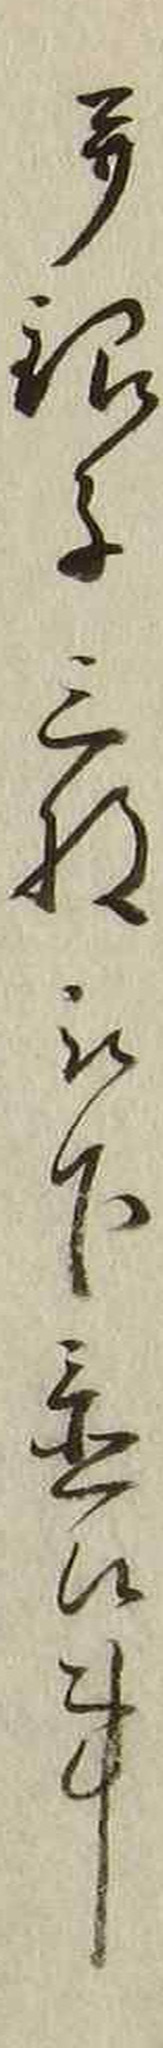并銀子三枚被下置候事
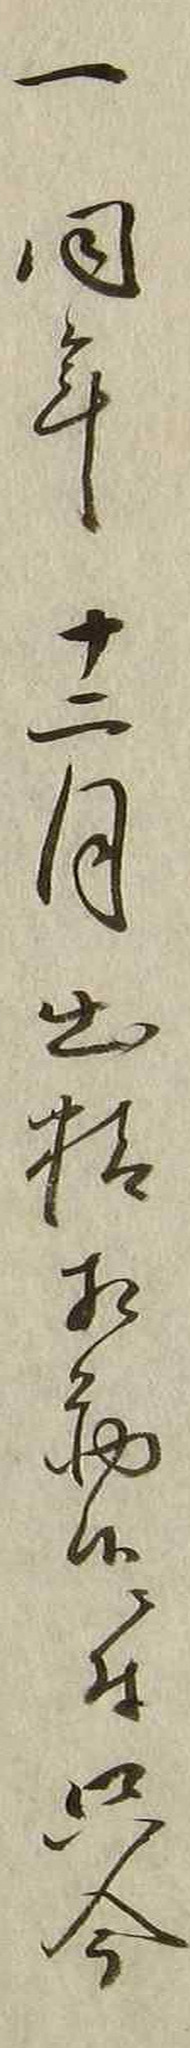一同年十二月出精相勤候ニ付只今
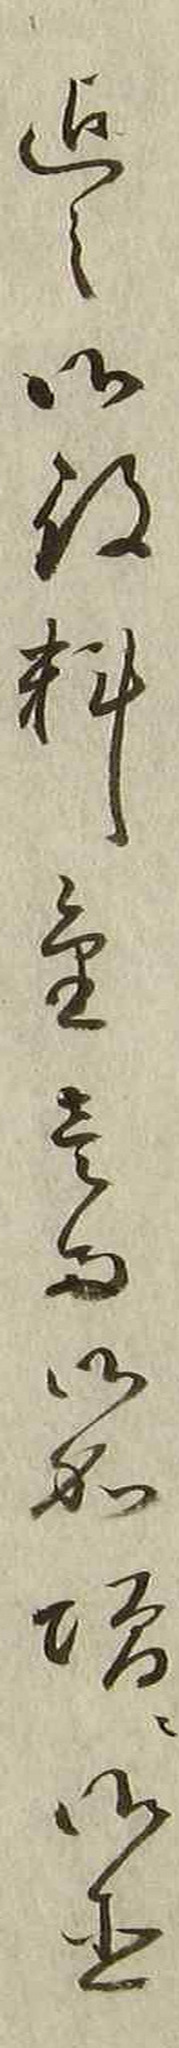迄之御役料金壱両御加増ニ御直
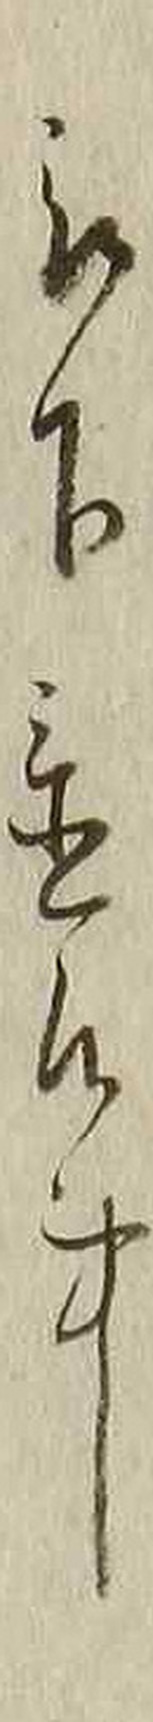被下置候事
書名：諸士系譜　巻之25　い之部25
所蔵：会津若松市立会津図書館
